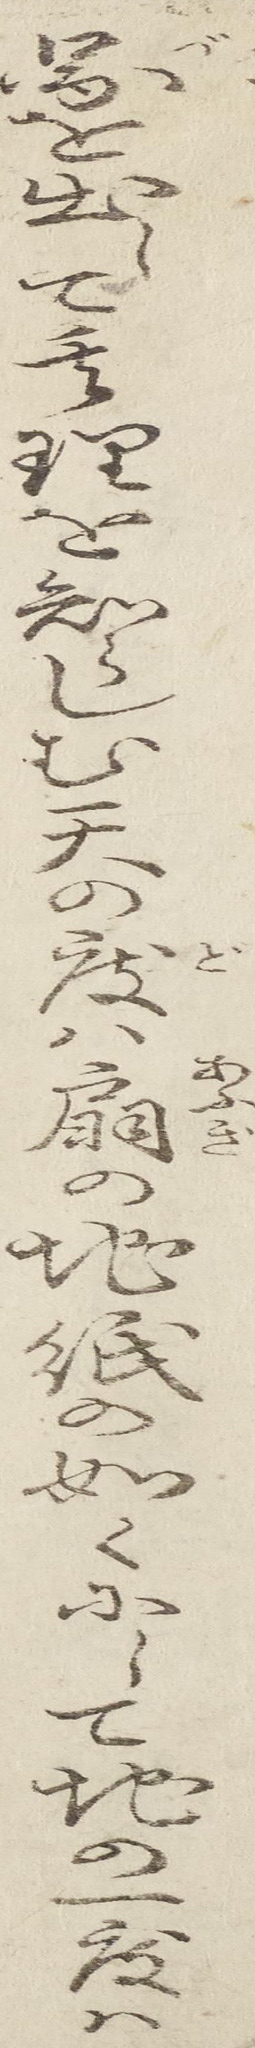図を出して其理を知らしむ天の度は扇の地紙の如くにして地の一度は
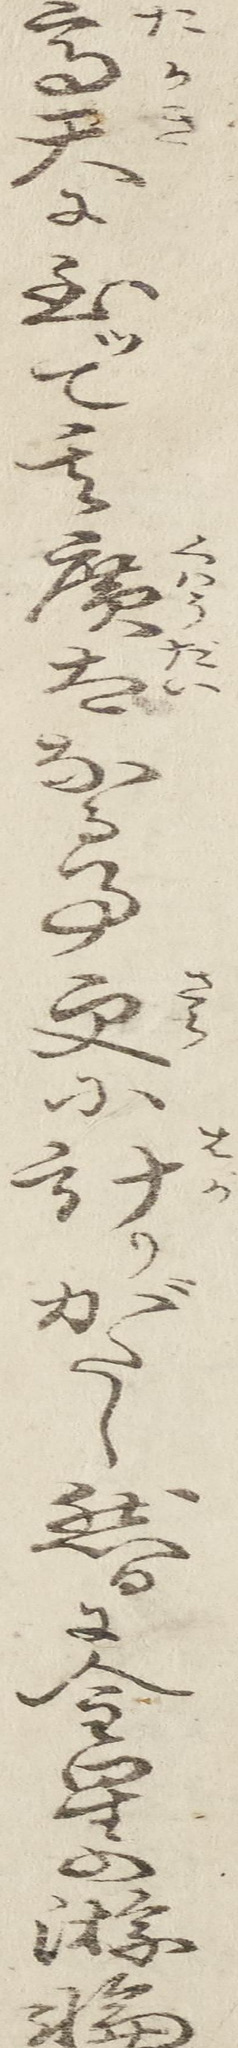高天に至つて其広太なる事更に計りがたし然るに金星の游輪
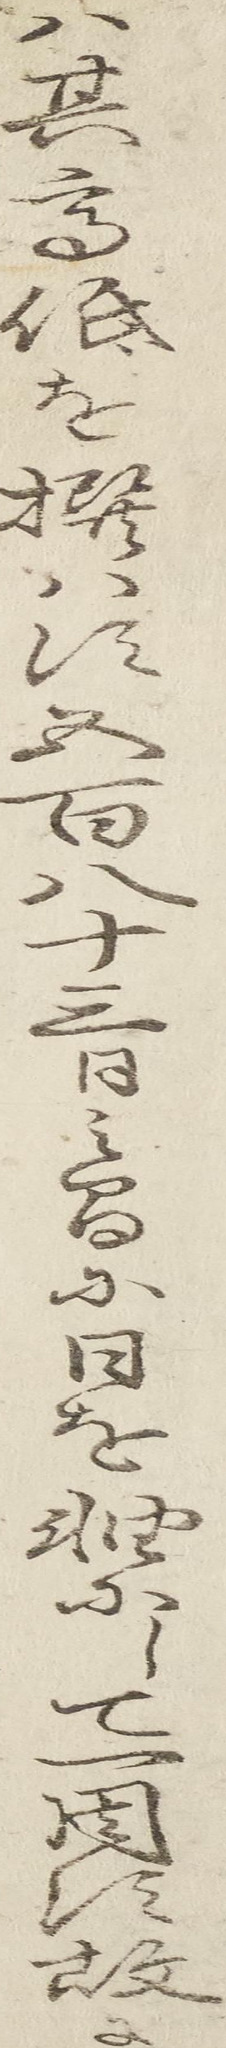は其高低を撰はす五百八十三日之間に日を軸にして一周す故に
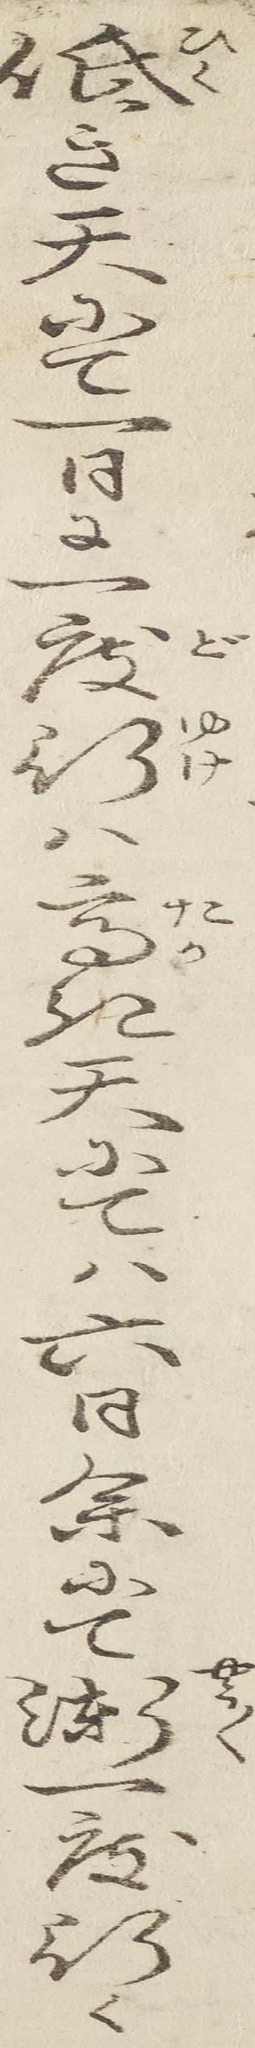低き天にて一日に一度行は高き天にては六日余にて漸一度行く
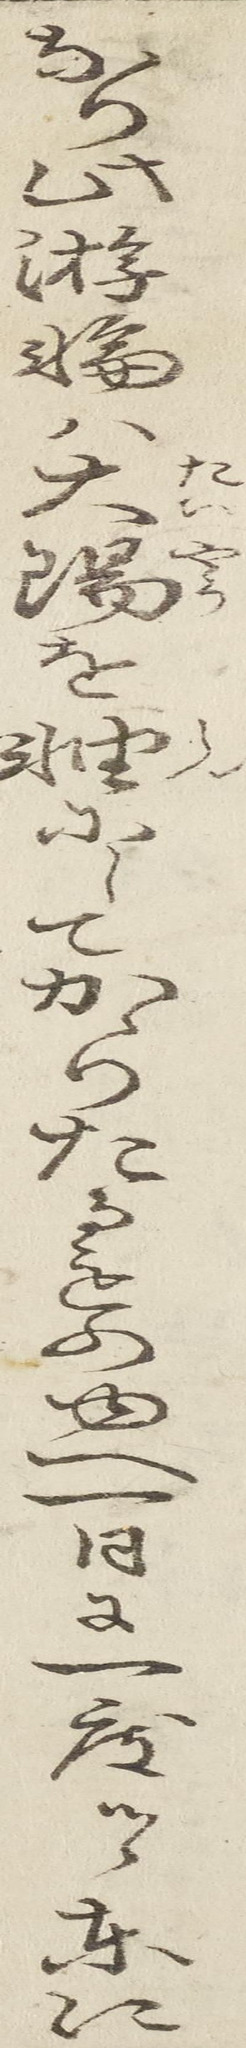なり此游輪は大陽を軸にしてかゝりたるものゆへ一日に一度つゝ東に
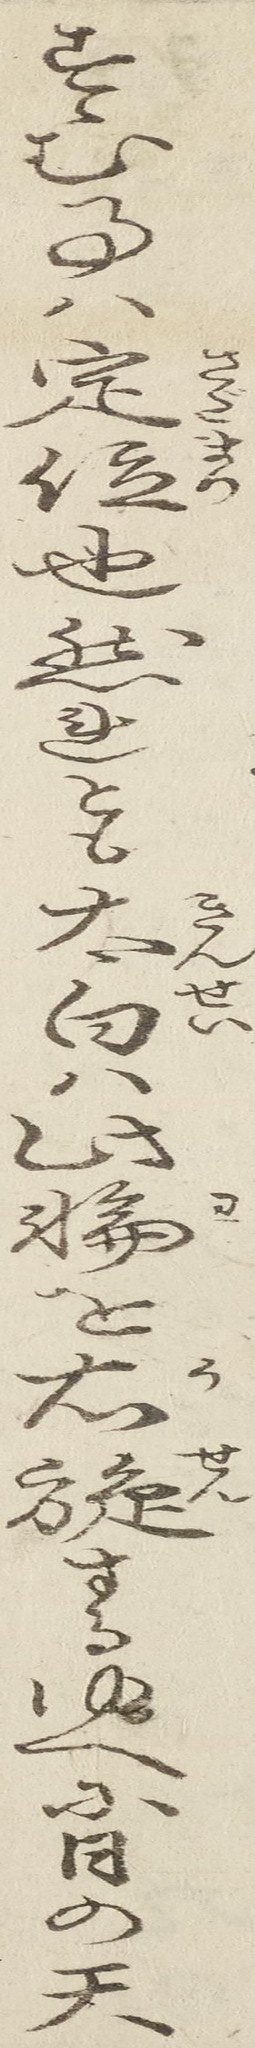すゝむ事は定位也然れとも太白は此輪を右旋するゆへに日の天
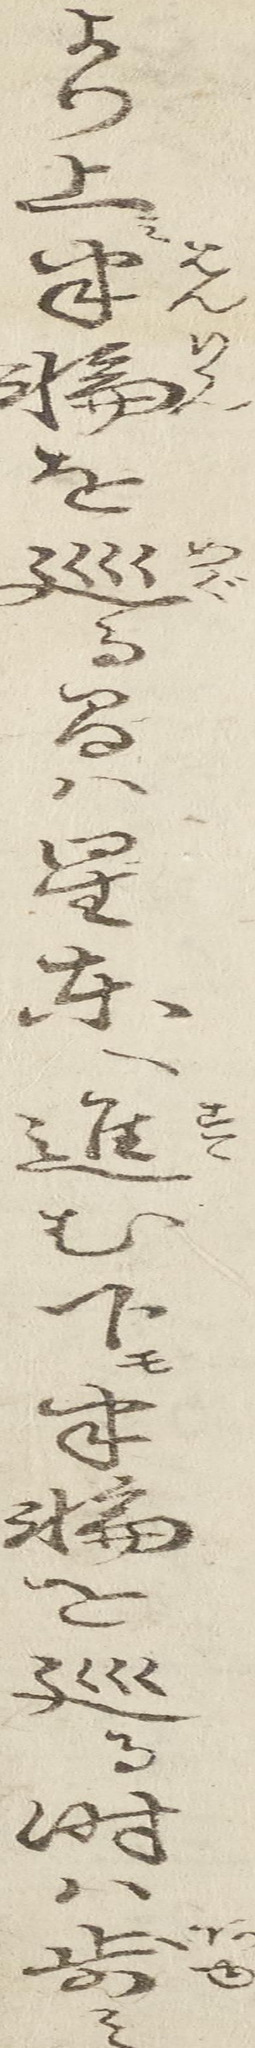より上半輪を巡る間は星東へ進む下半輪を巡る時は歩み
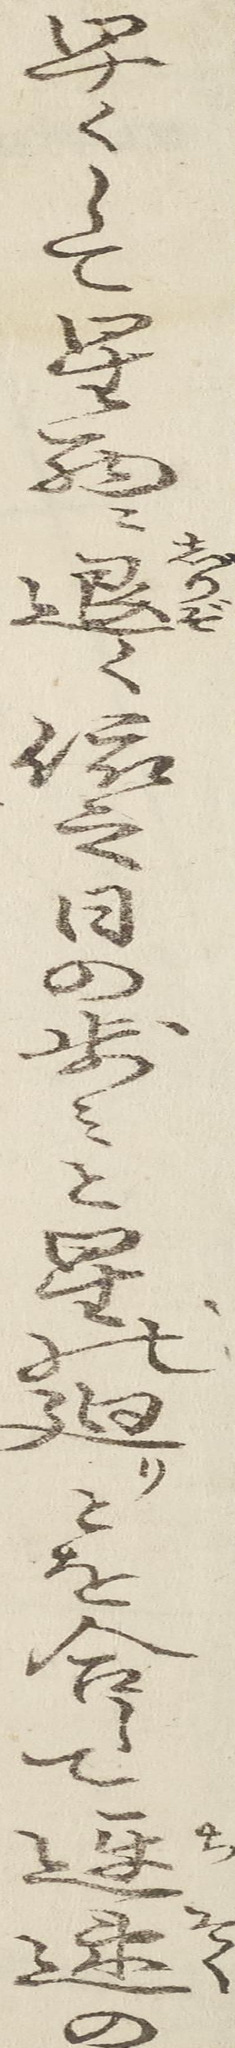早くして星西ニ退く依之日の歩みと星の廻リとを合して遅速の
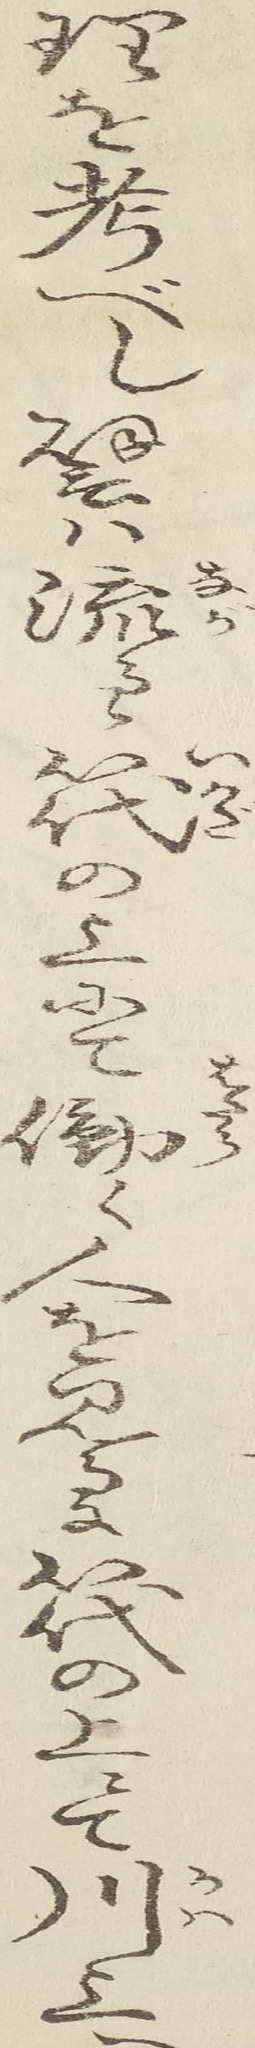理を考べし譬は流るゝ筏の上にて働く人を見るに筏の上ニて川上へ
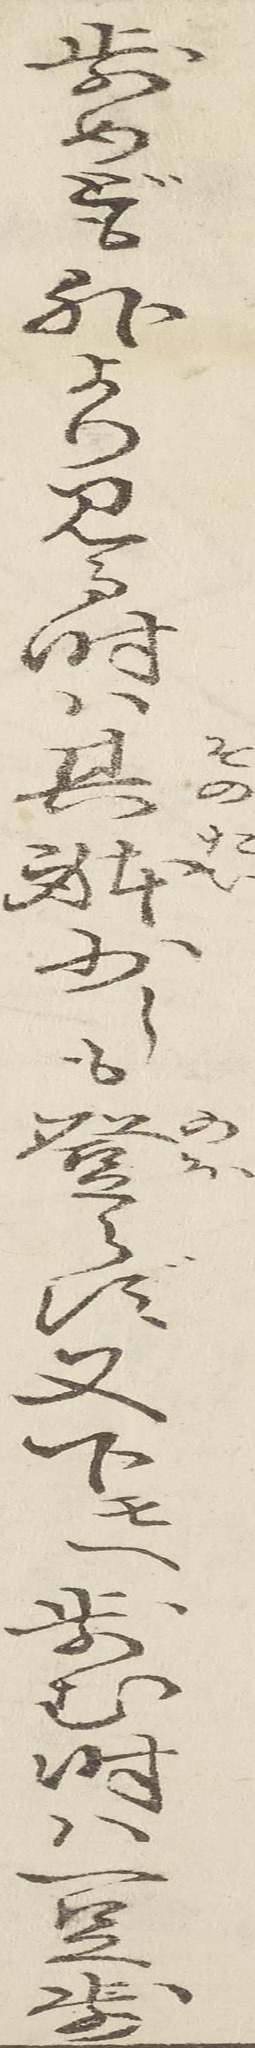歩めども外より見る時は其躰少しも登らず又下歩む時は一足歩
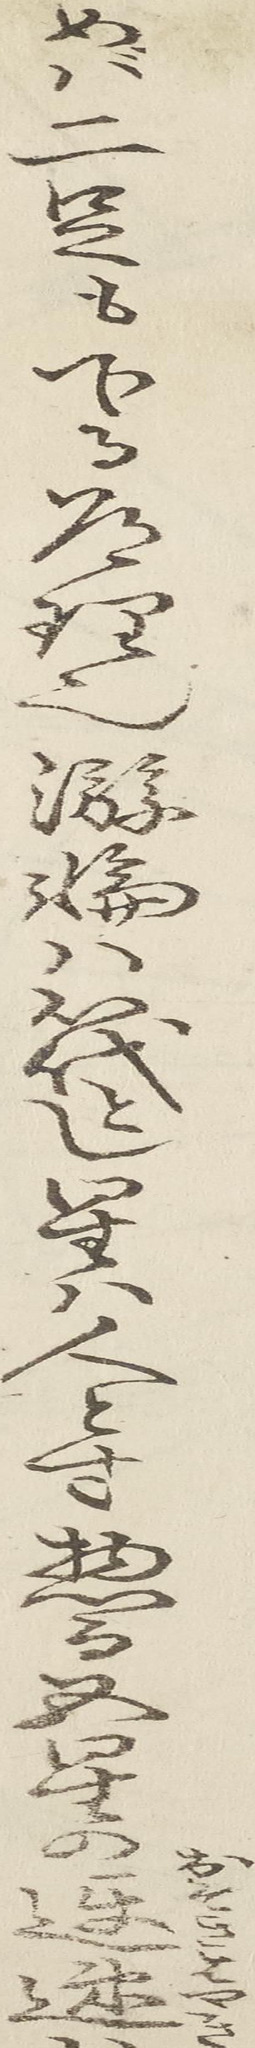めば二足も下る道理也游輪は筏とし星は人とす惣而五星の遅速は
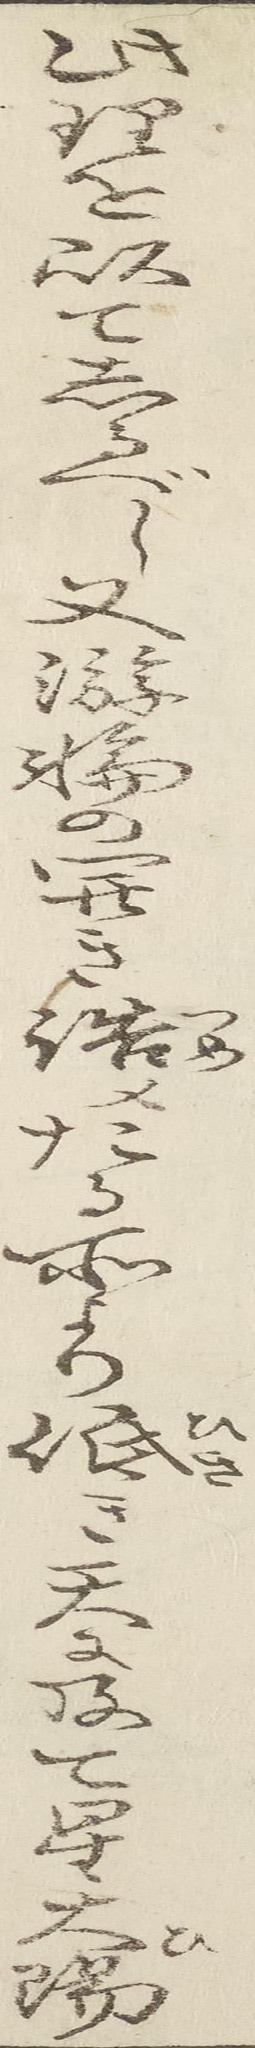此理を以てしるべし又游輪の開き詰所より低き天に及て星大陽
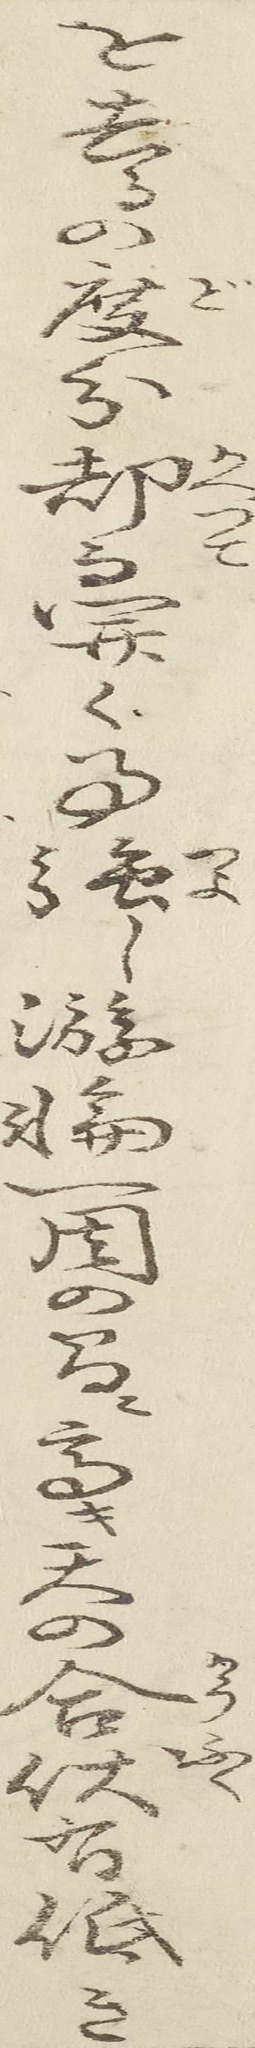を去るの度分却而開く事強し游輪一周の間ニ高キ天の合伏有低き
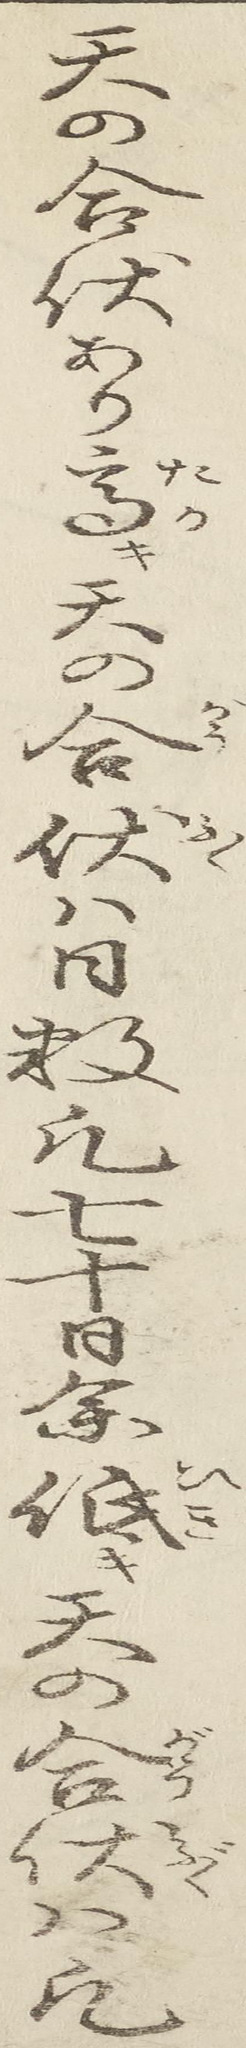天の合伏あり高キ天の合伏は日数凡七十日余低キ天の合伏は凡
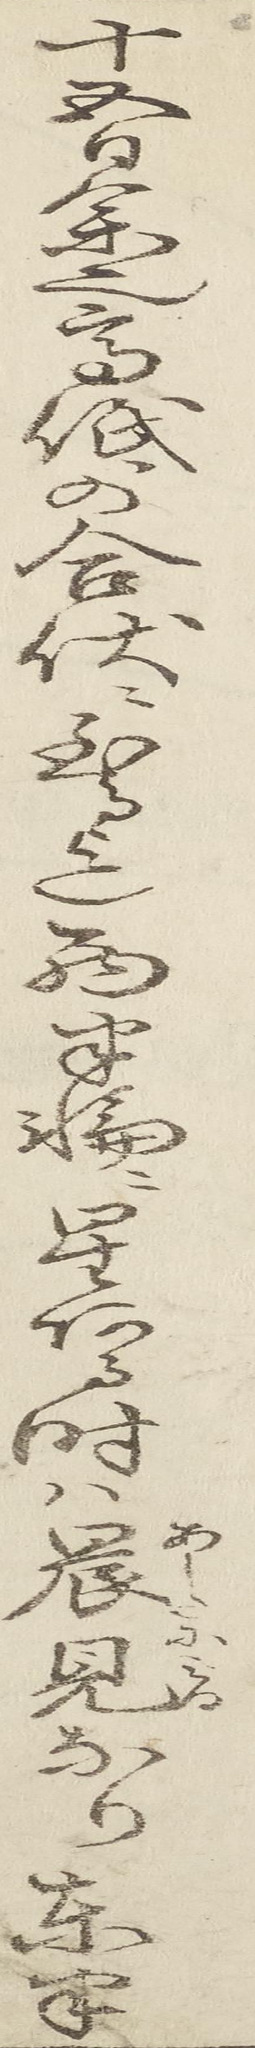十五日余也高低の合伏ニ至る迄西半輪ニ星ある時は晨見なり東半
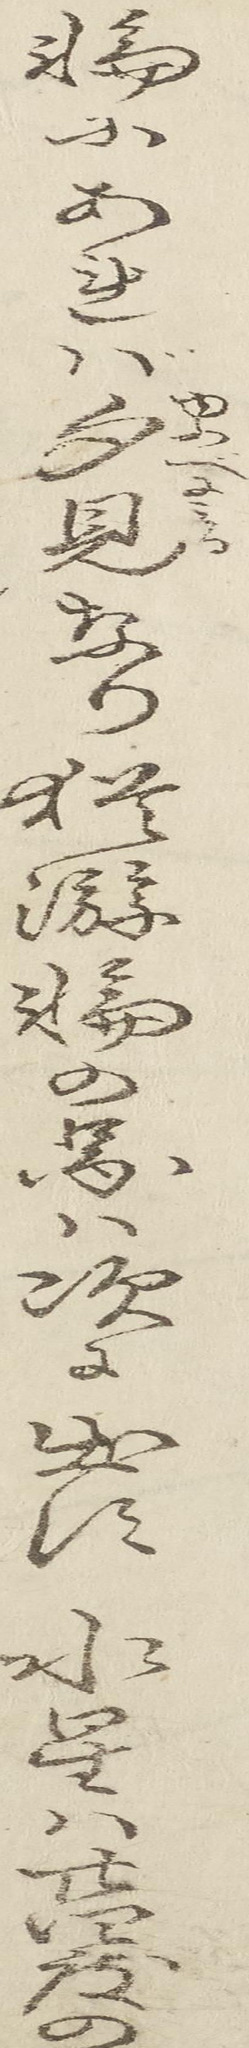輪にあれば夕見なり猶游輪の図は次に出す水星は廿四度の
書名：平天儀圖解
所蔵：東京大学地震研究所図書室 Earthquake Research Institute Library, The University of Tokyo, JAPAN
